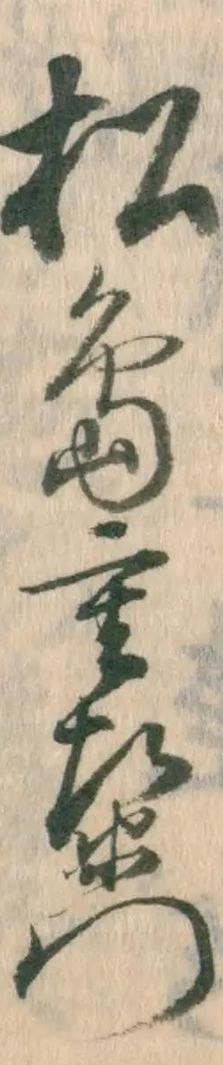松島重左衛門
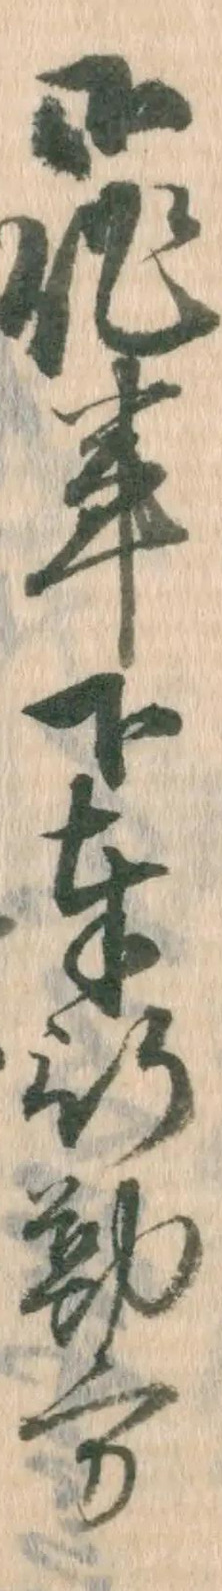御作事下奉行勤方
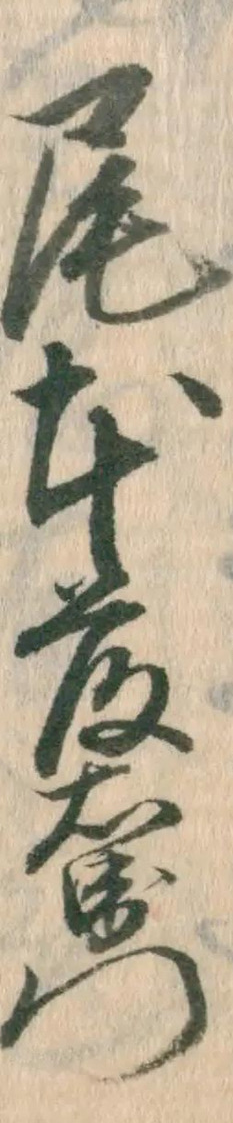尾本藤右衛門
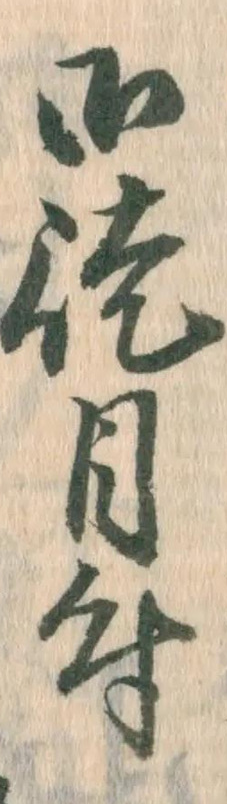御徒目付
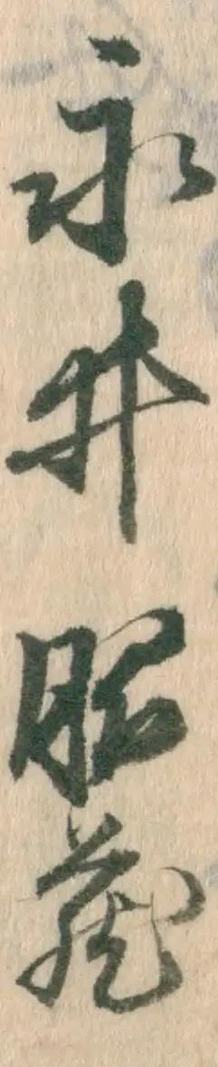永井脇蔵

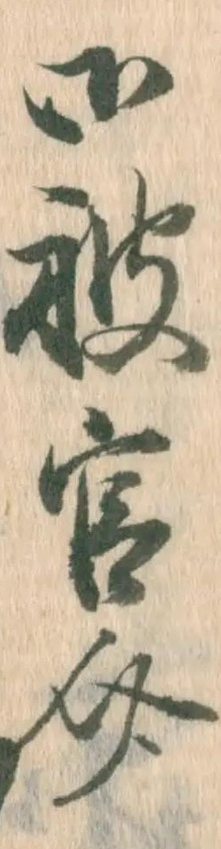御被官介
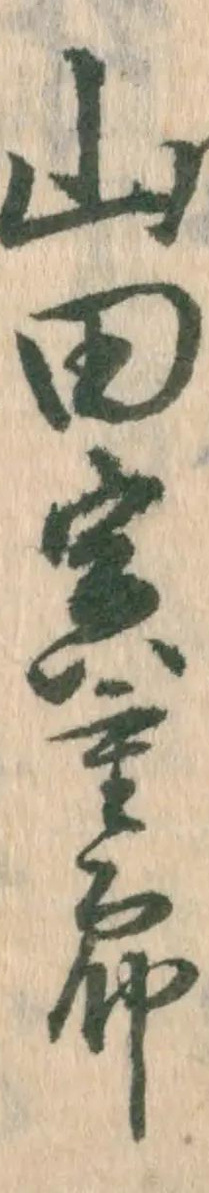山田寅重郎
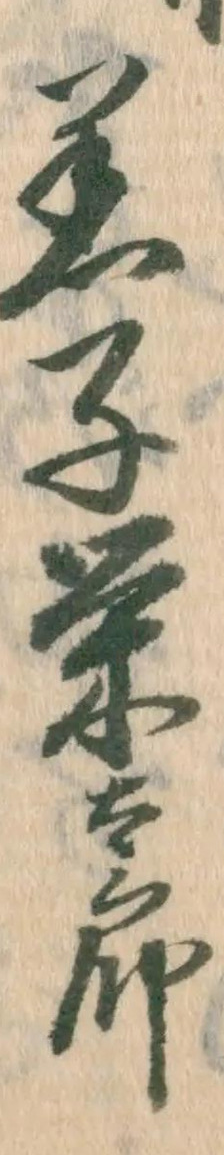兼子栄太郎
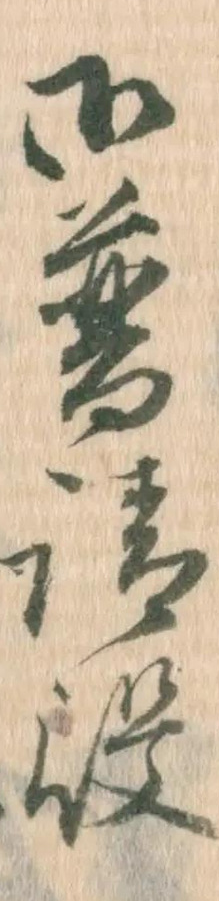御普請役
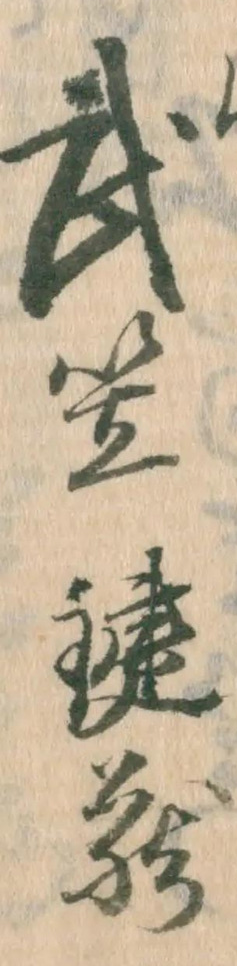武笠鍵蔵
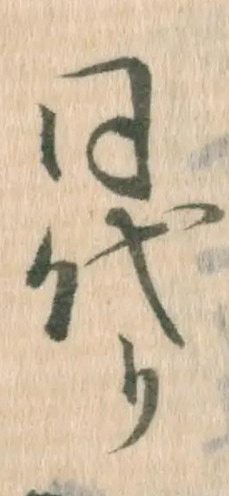同代り
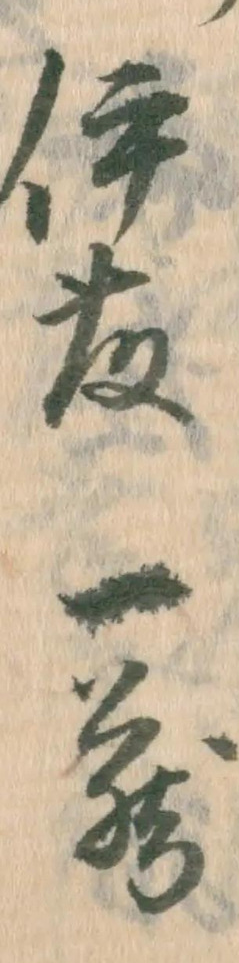伊藤一蔵
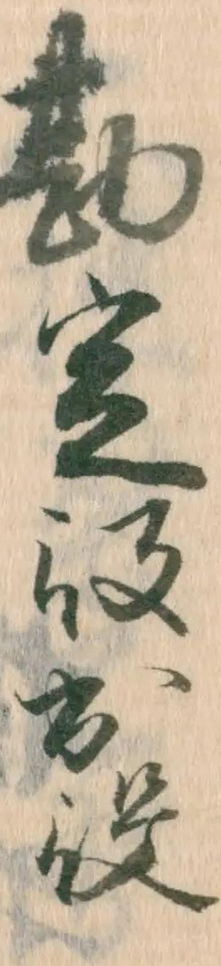勘定役出役
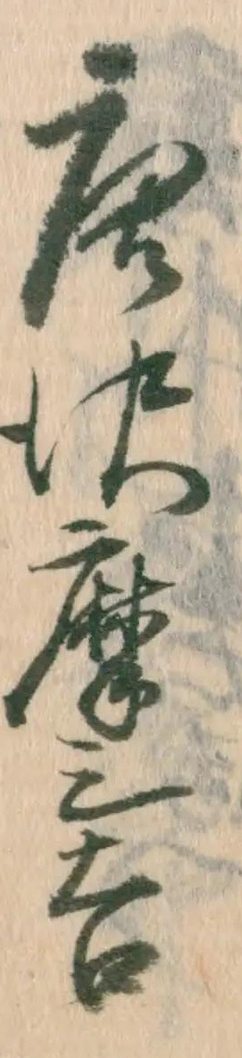唐沢摩三吉
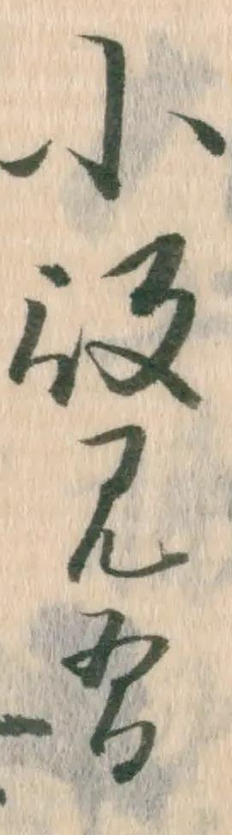小役見習
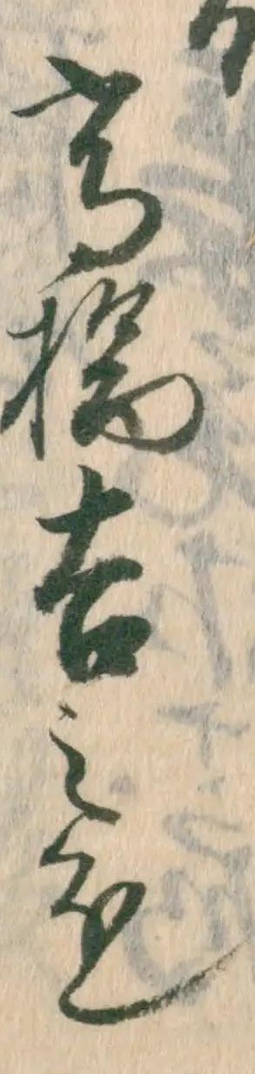高橋吉之進
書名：七十冊物類集 71巻. [44] 四十三 牢屋敷御普請御修覆地震ニ付骨折候牢屋掛御褒美之部
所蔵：国立国会図書館 National Diet Library, JAPAN
